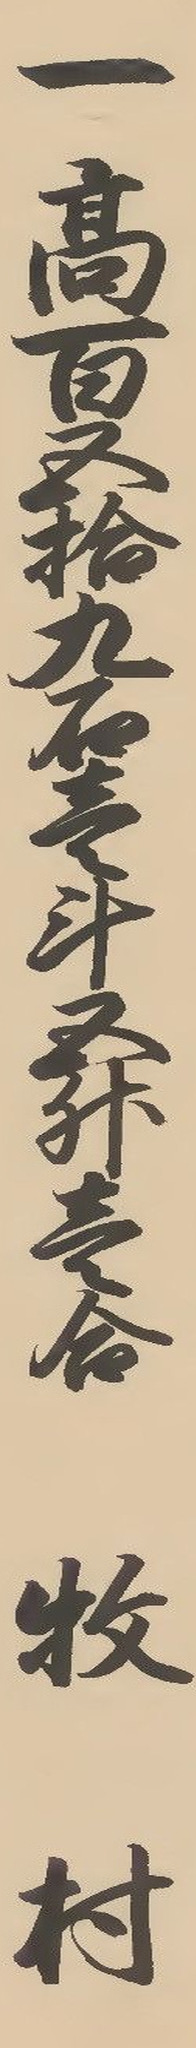一高百五拾九石壱斗五升壱合牧村
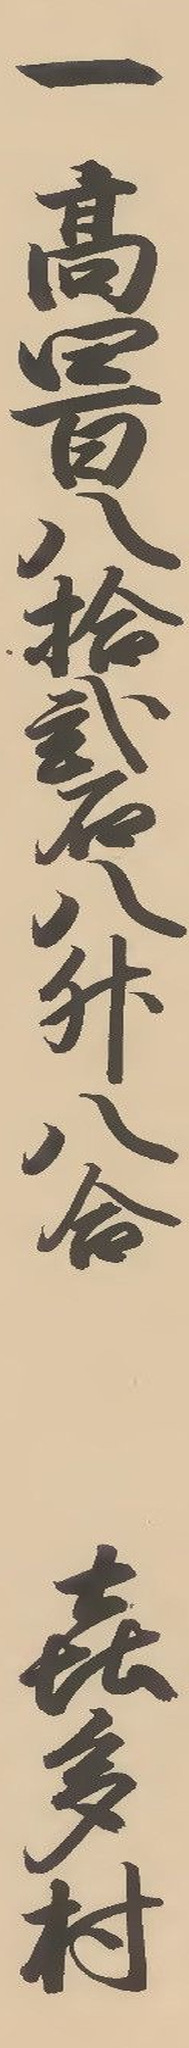一高四百八拾弐石八升八合喜多村
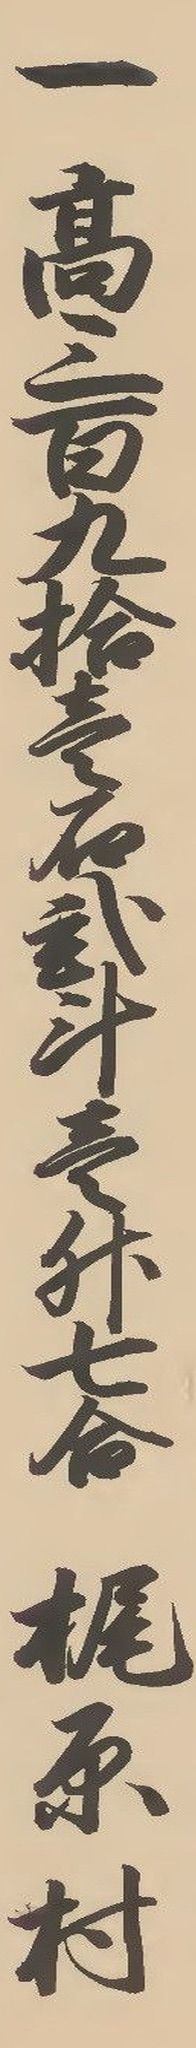一高三百九拾壱石弐斗壱升七合梶原村

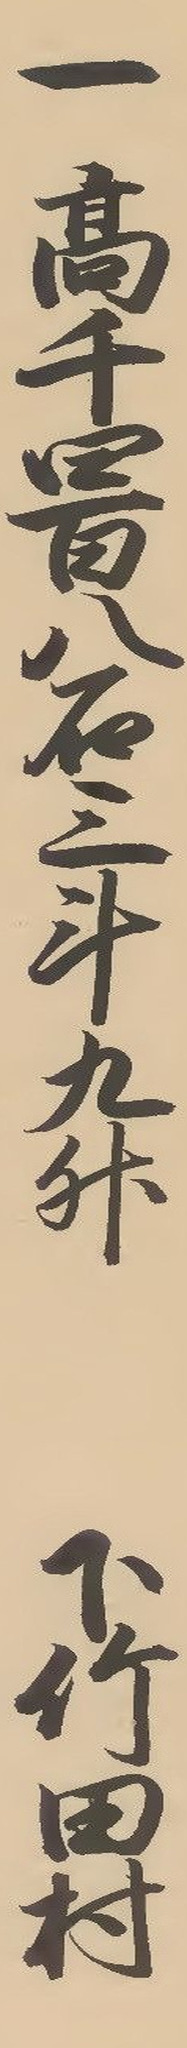一高千四百八石三斗九升下竹田村
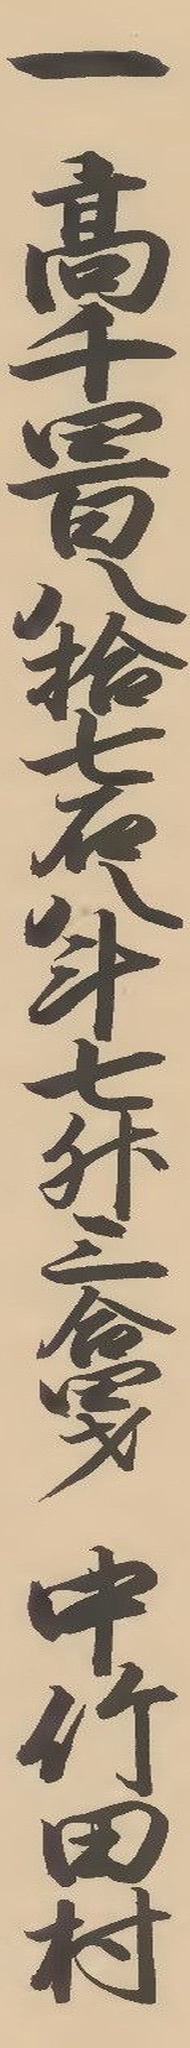一高千四百八拾七石八斗七升三合四才中竹田村
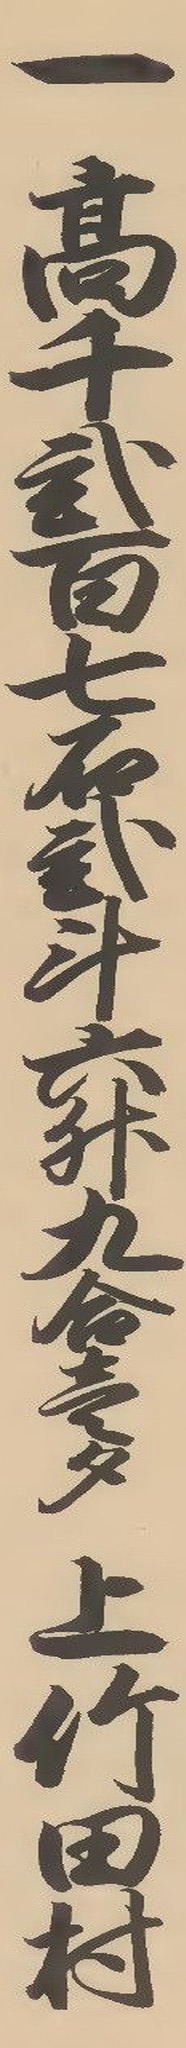一高千弐百七石弐斗六升九合壱勺上竹田村
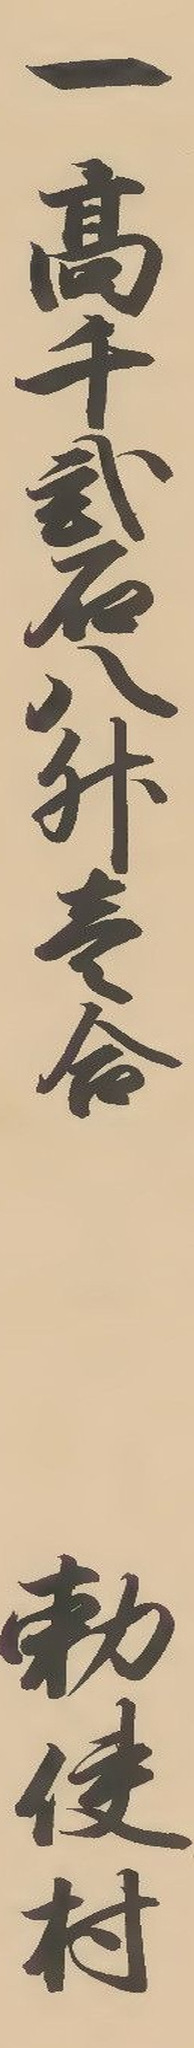一高千弐石八升壱合勅使村
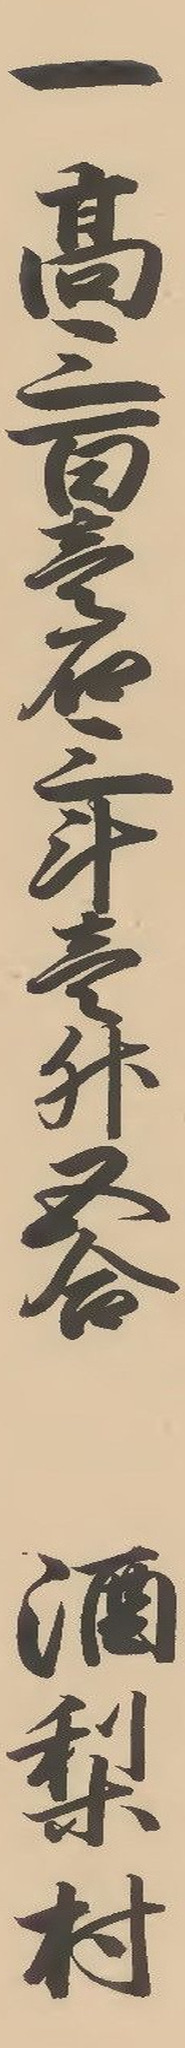一高三百壱石三斗壱升五合酒梨村

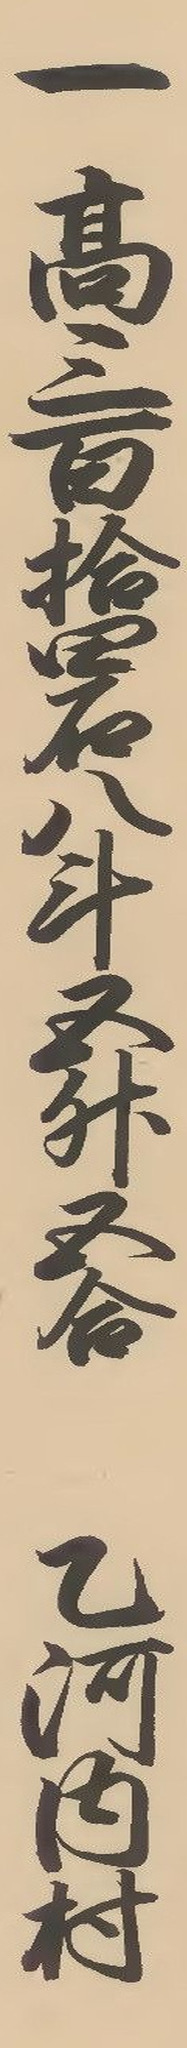一高三百拾四石八斗五升五合乙河内村
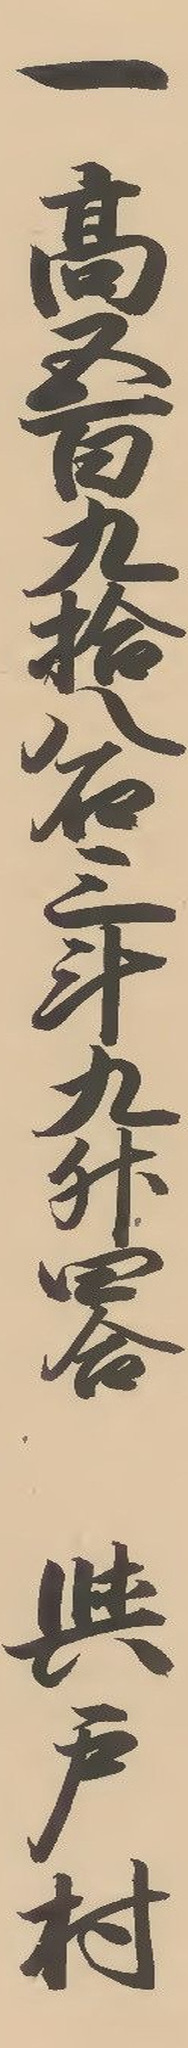一高五百九拾八石三斗九升四合与戸村
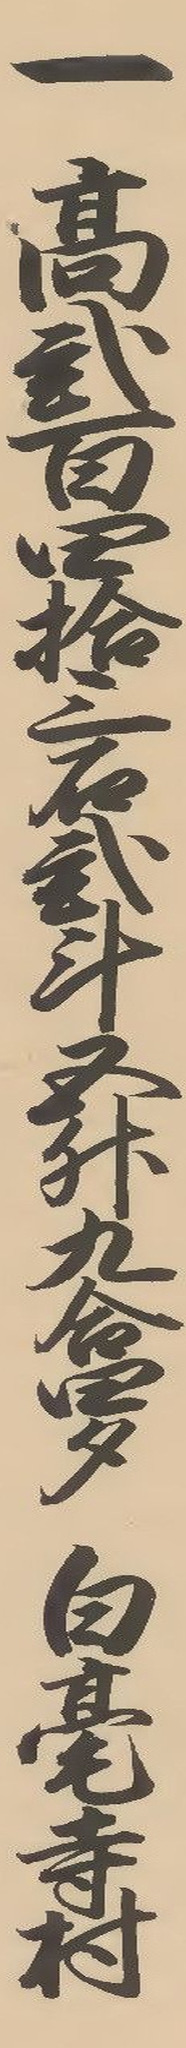一高弐百四拾三石弐斗五升九合四勺白毫寺村
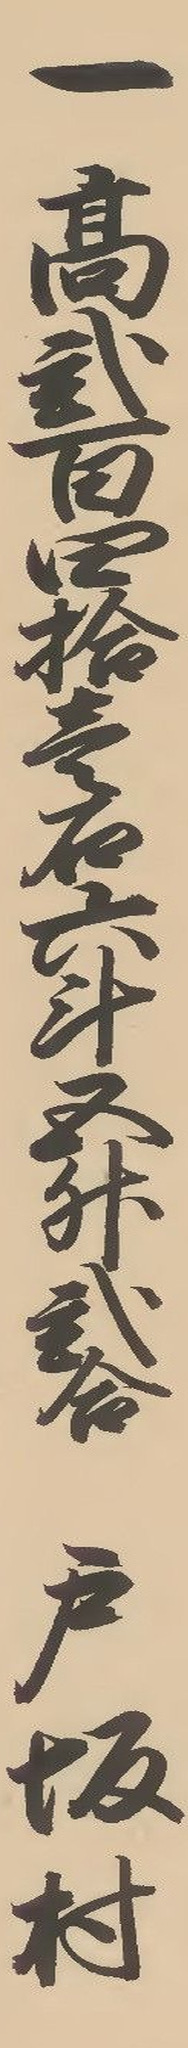一高弐百四拾壱石六斗五升弐合戸坂村
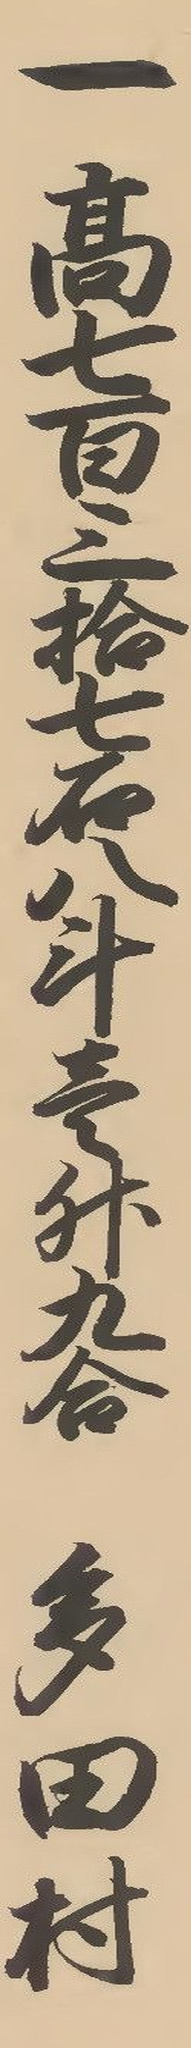一高七百三拾七石八斗壱升九合多田村
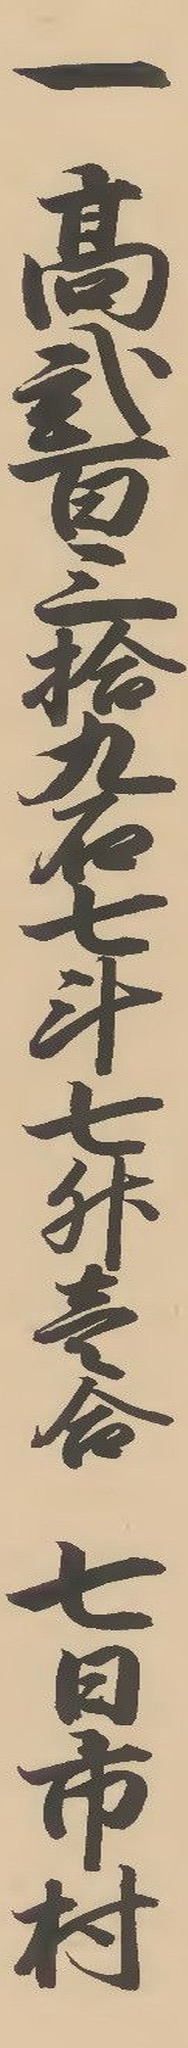一高弐百三拾九石七斗七升壱合七日市村
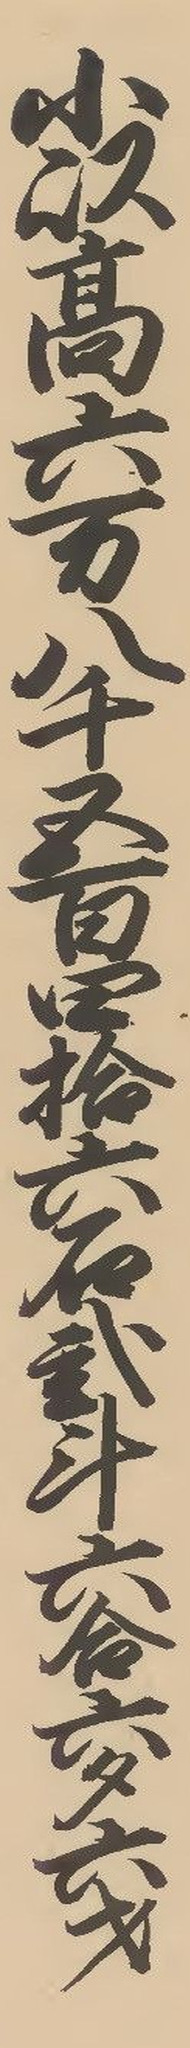小以高六万八千五百四拾六石弐斗六合六勺六才

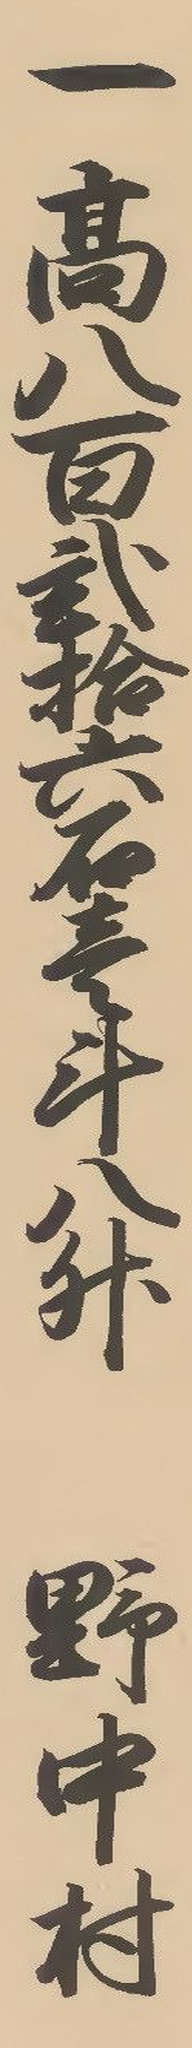一高八百弐拾六石壱斗八升野中村
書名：丹波国郷帳
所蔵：国立公文書館 National Archives of Japan
